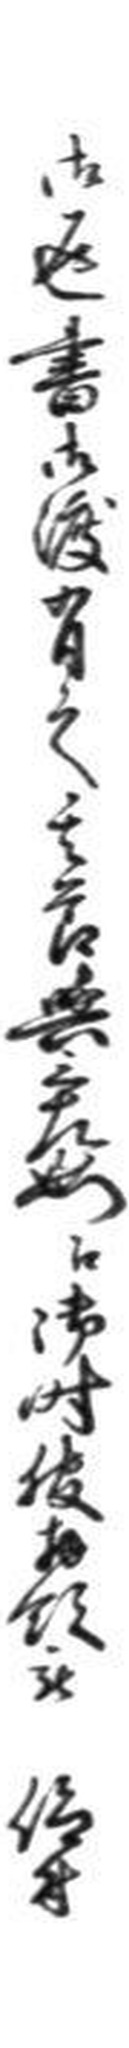御返書御渡有之其節与三左衛門江御時服拝領被仰付
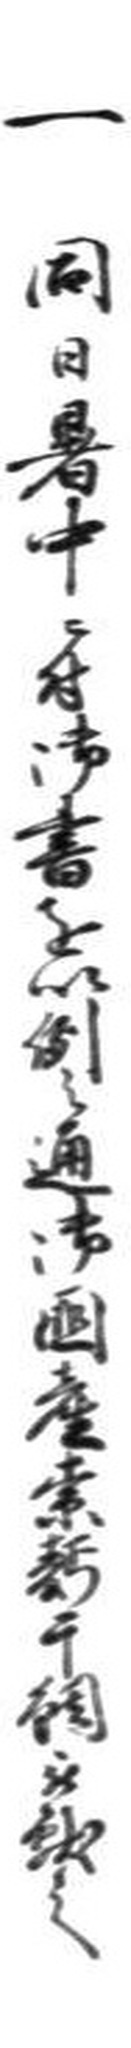一同日暑中ニ付御書を以例之通御国産素麪干鯛被献之
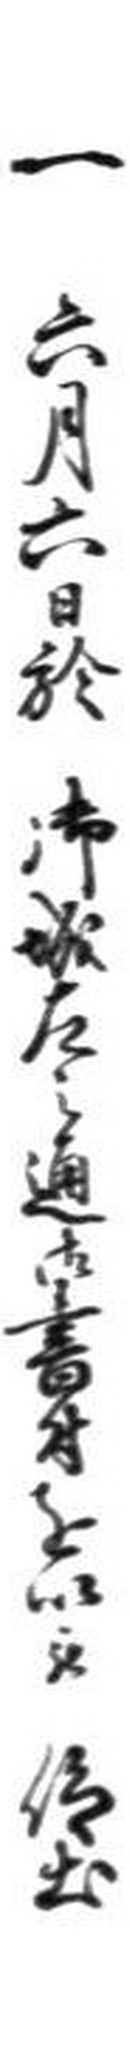一六月六日於御城左之通御書付を以被仰出
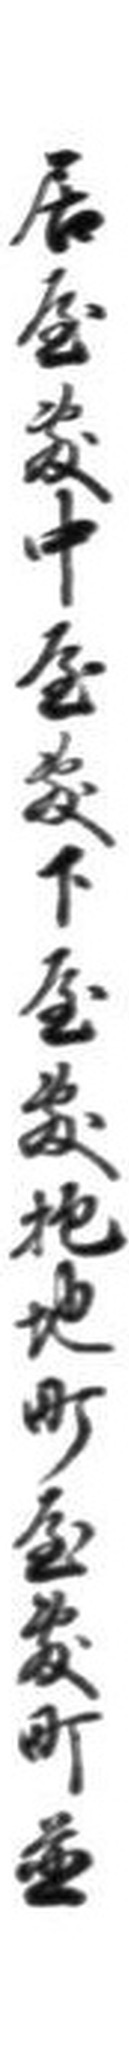居屋敷中屋敷下屋敷抱地町屋敷並
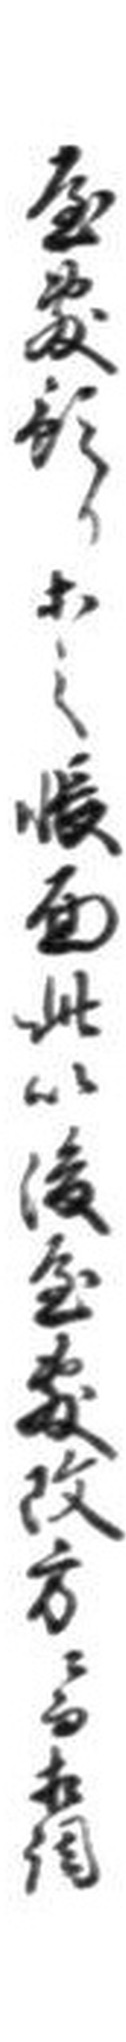屋敷預り等之帳面此以後屋敷改方ニ而相調
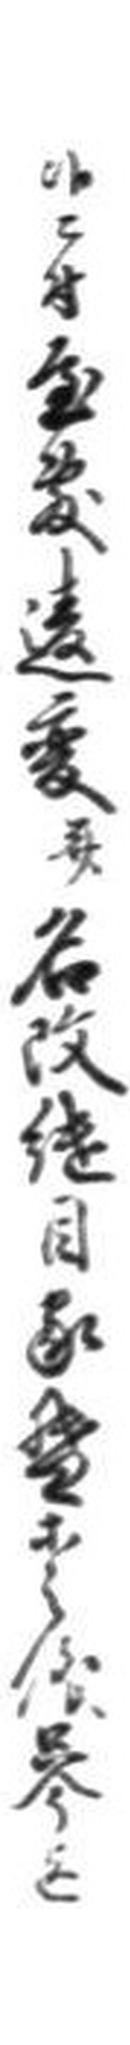候ニ付屋敷違変并名改継目家督等之儀只今迄
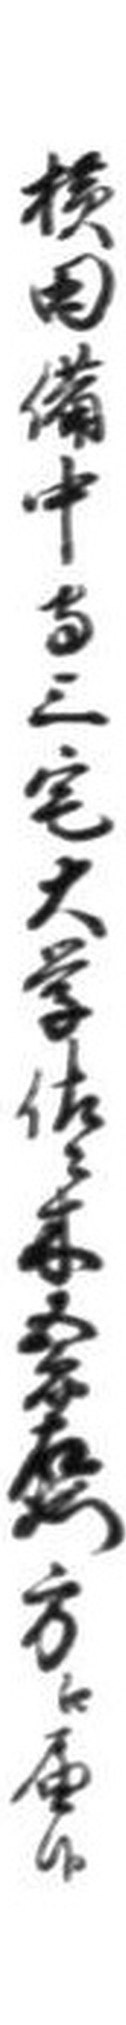横田備中守三宅大学佐々木五郎右衛門方江届候

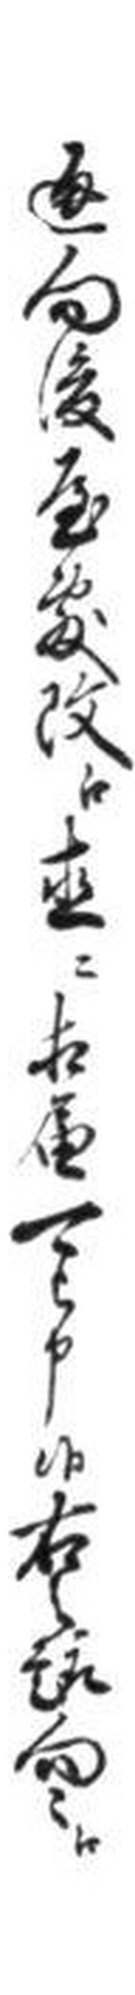通向後屋敷改江直ニ相届可被申候右之趣向々江
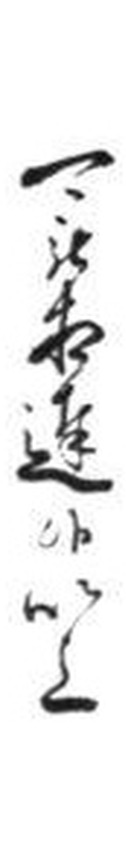可被相達候以上
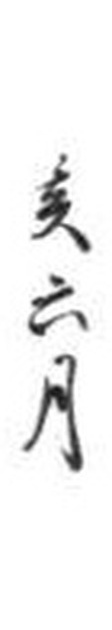亥六月
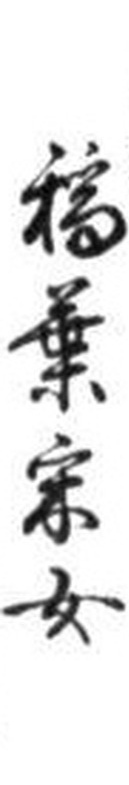稲葉采女
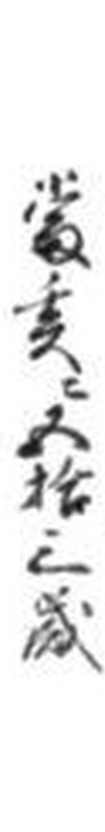当亥ニ五拾三歳
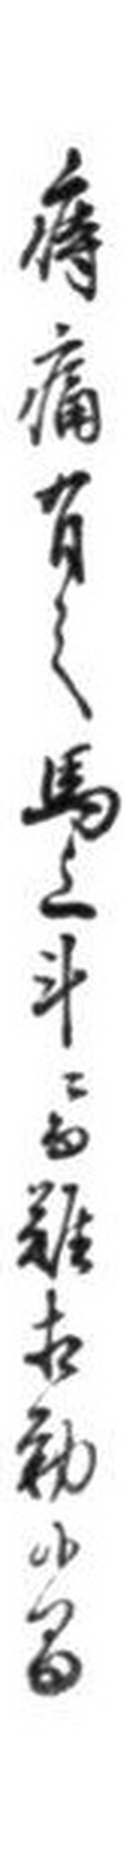痔痛有之馬上斗ニ而難相勤候間
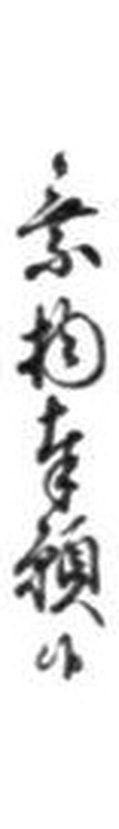乗物奉願候
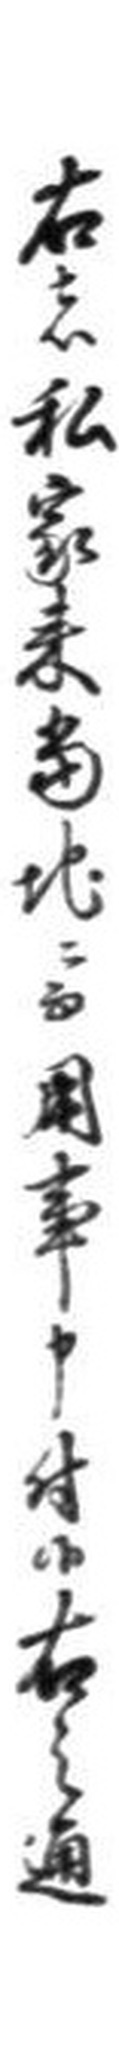右者私家来当地ニ而用事申付候右之通
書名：家譜 三十三 吉邦公 享保四年
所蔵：福井県文書館 Fukui Prefectural Archives
